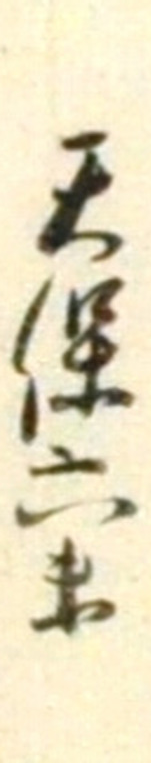天保六未
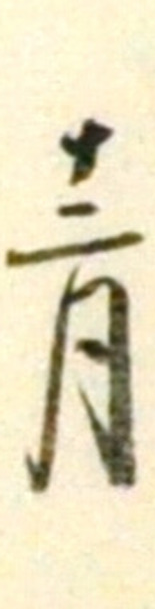十二月
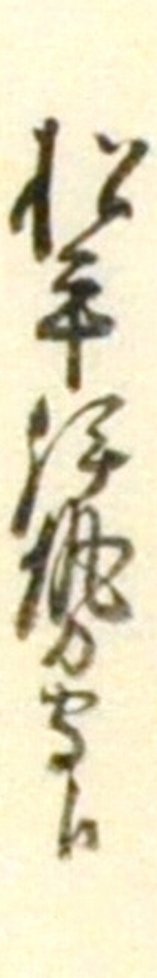松平伊勢守え
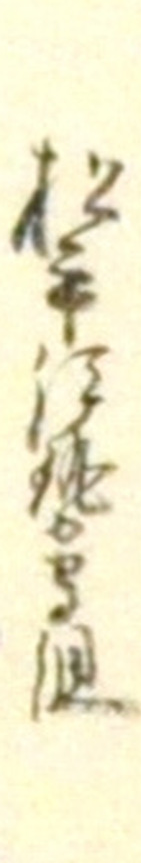松平伊勢守組
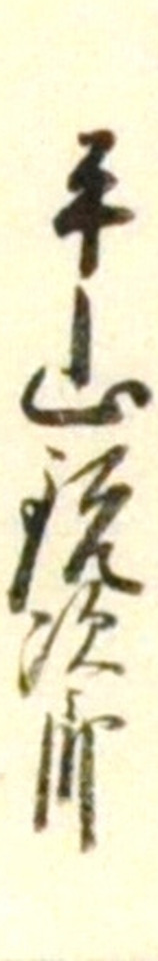平山鋭次郎
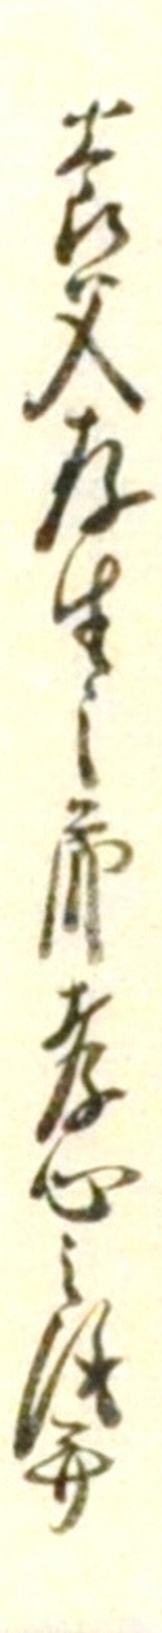養父存生之節孝心之儀并
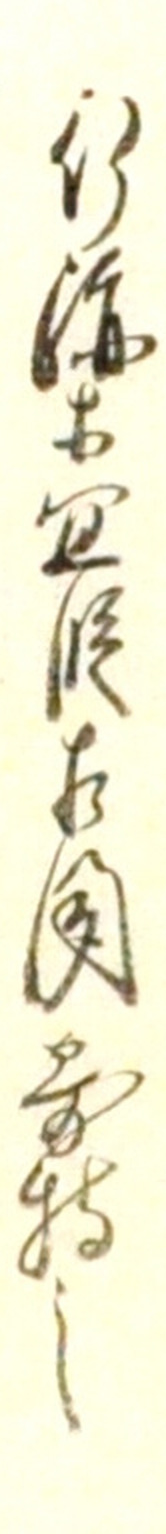行跡等宜段相聞奇特之
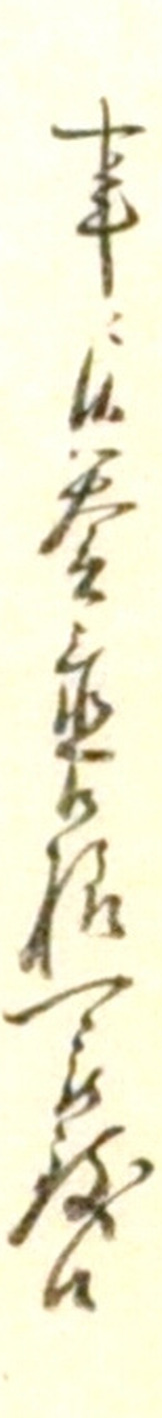事に候誉置候様可被致候
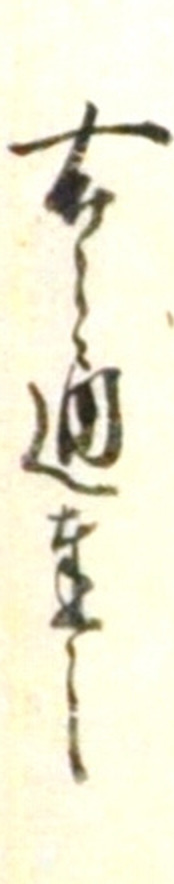右之通達之
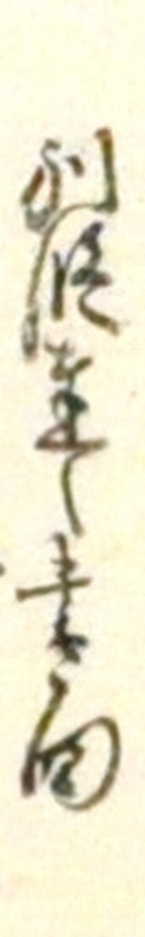別段達之書面
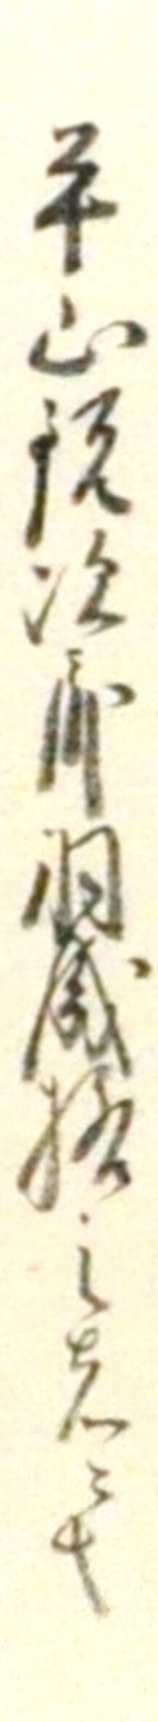平山鋭次郎羽織格之者には
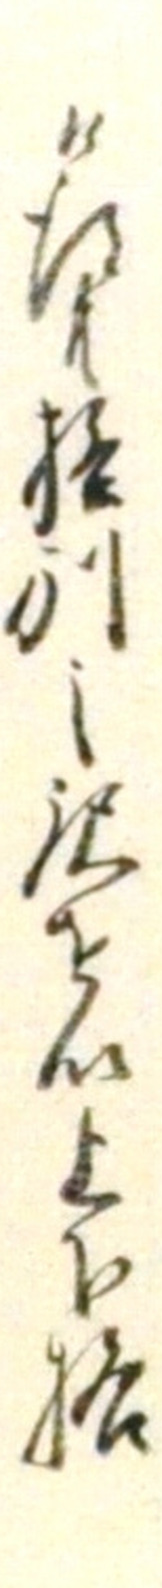候得共格別之訳を以上下格
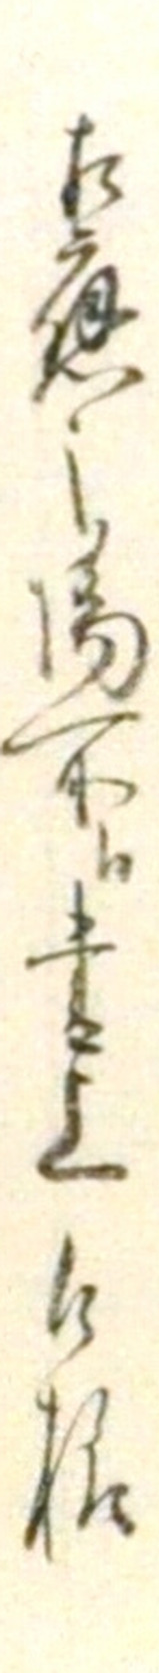相応之場所え書上候様
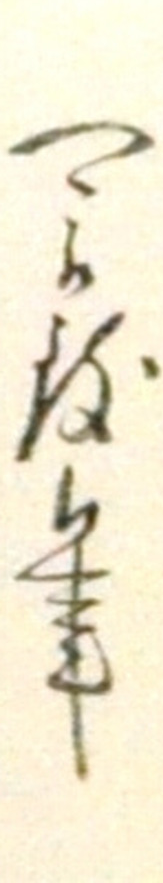可被致候事
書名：書抜
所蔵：伊那市立高遠町図書館・合同会社AMANE
